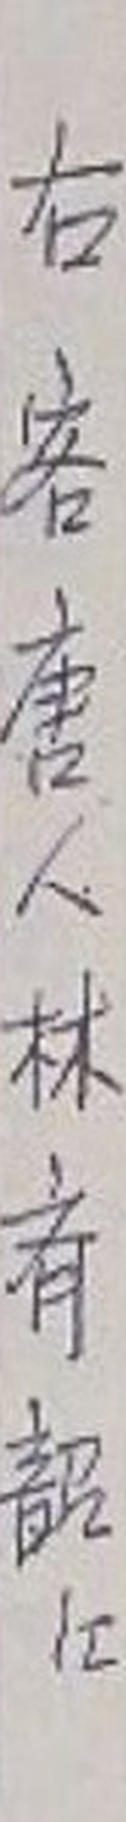右客唐人林斉韶え
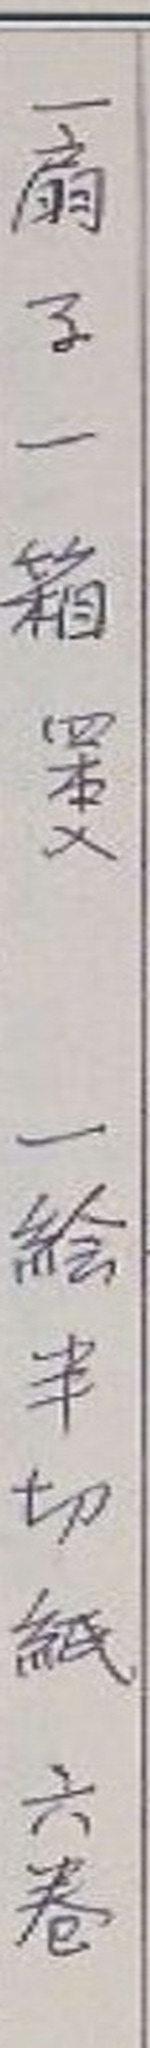一扇子一箱四本入一絵半切紙六巻
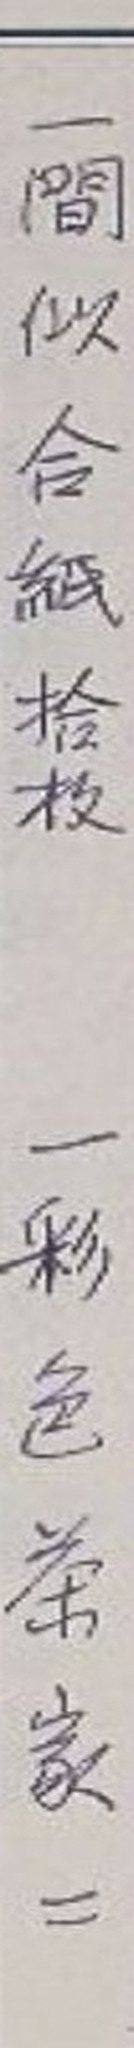一間似合紙拾枚一彩色茶家二
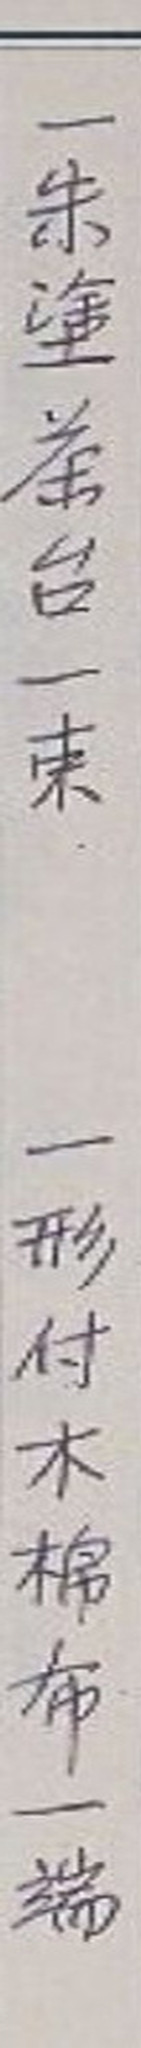一朱塗茶台一束一形付木棉布一端
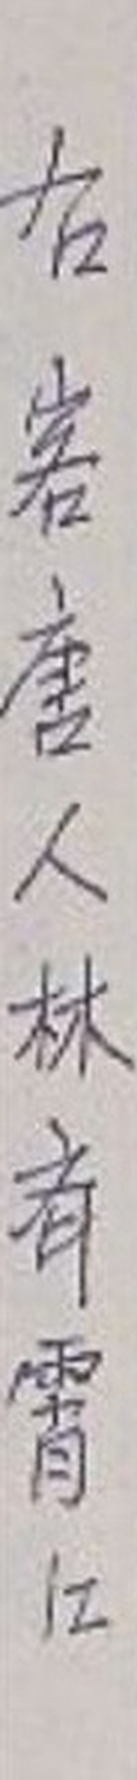右客唐人林斉韶え
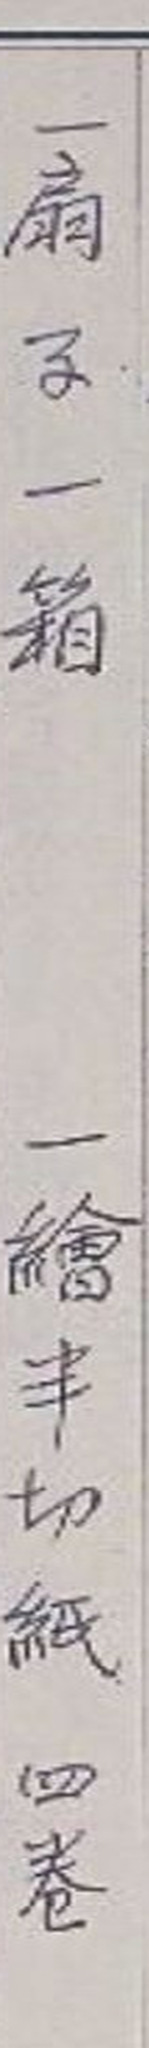一扇子一箱一絵半切紙四巻
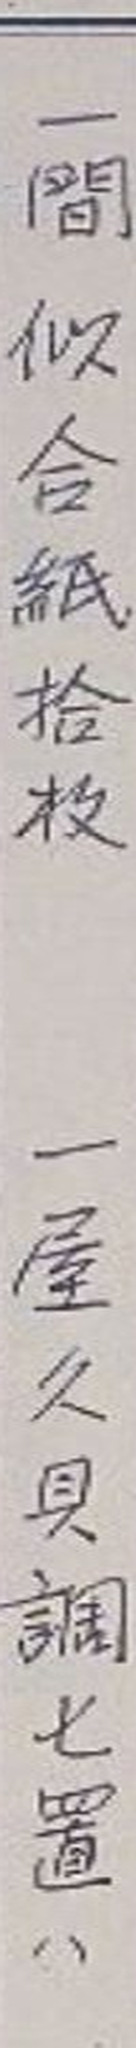一間似合紙拾枚一屋久貝調匕置八
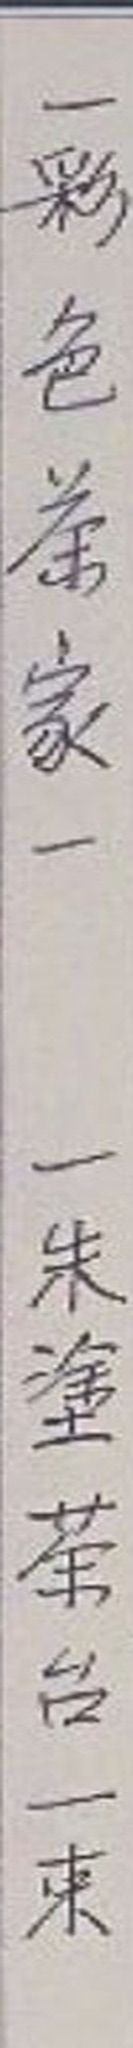一彩色茶家一一朱塗茶台一束
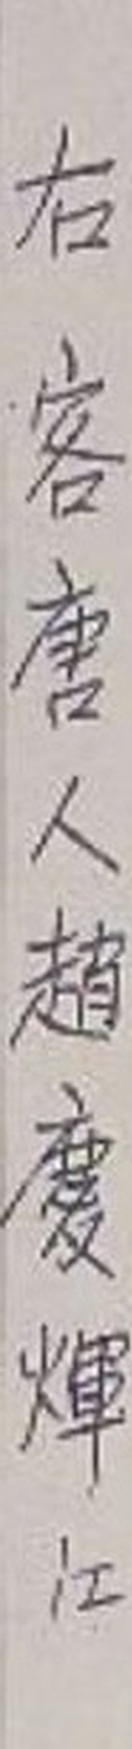右客唐人趙慶煇え

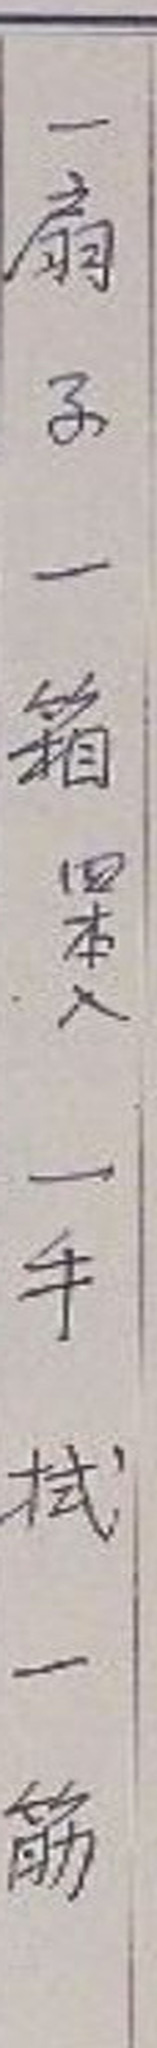一扇子一箱四本入一手拭一筋
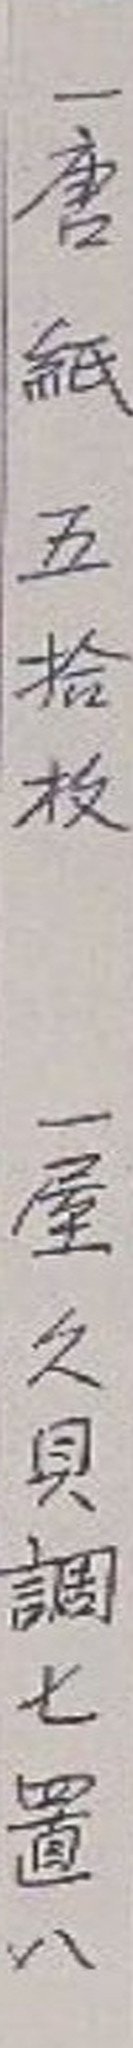一唐紙五拾枚一屋久貝調匕置八
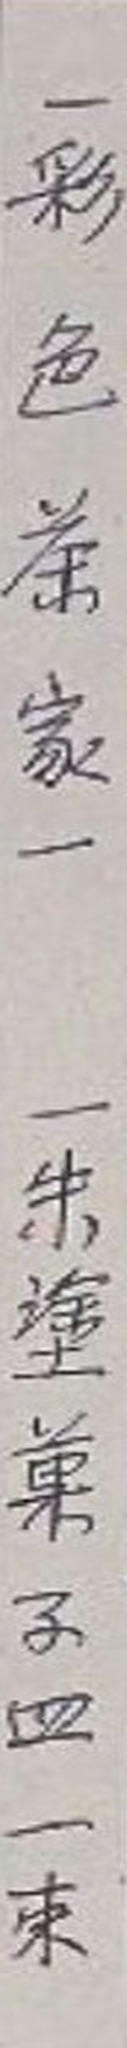一彩色茶家一一朱塗菓子皿一束
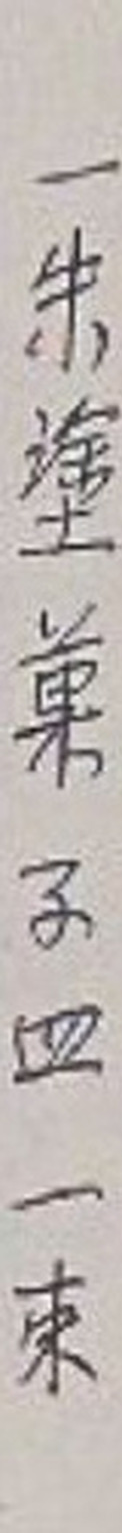一彩色茶家一一朱塗菓子皿一束
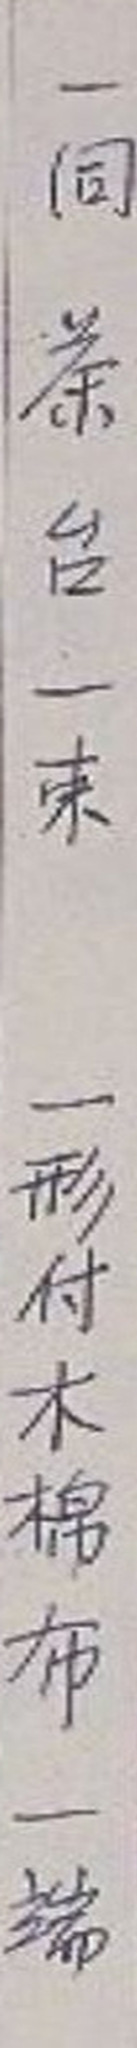一同茶台一束一形付木棉布一端
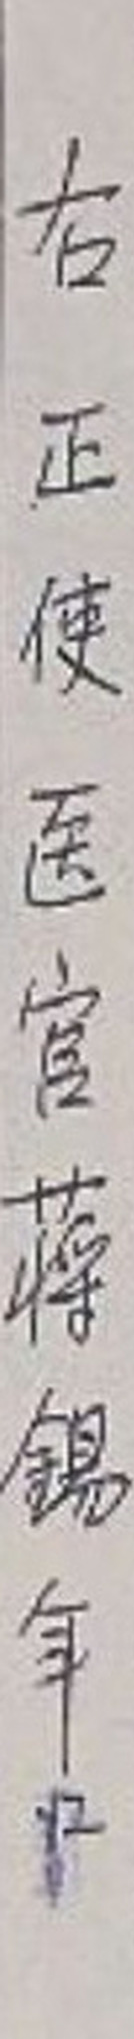右正使医官䉃錫年え
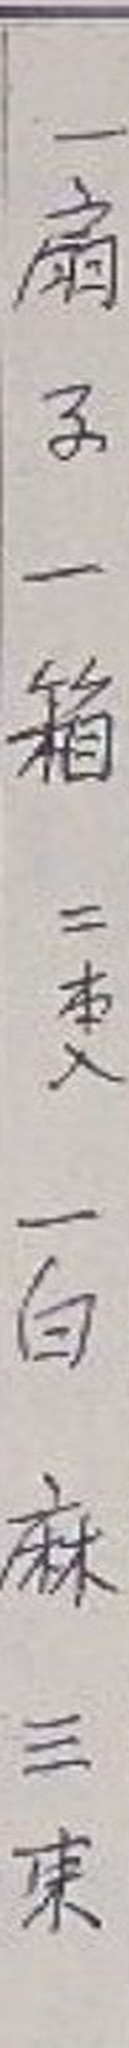一扇子一箱二本入一白麻三束
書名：支那冊封使来琉諸記 下巻
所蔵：University of the Ryukyus Library
